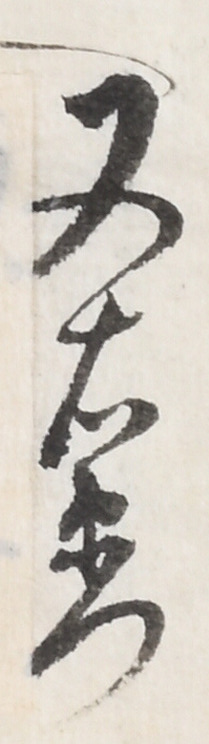又右衛門
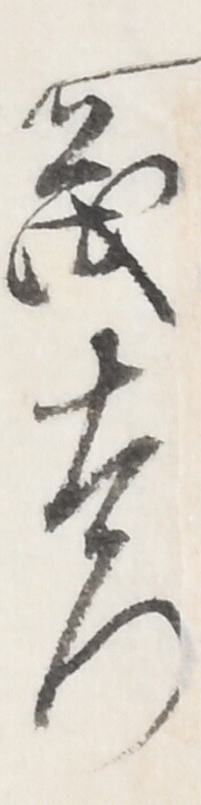茂右衛門
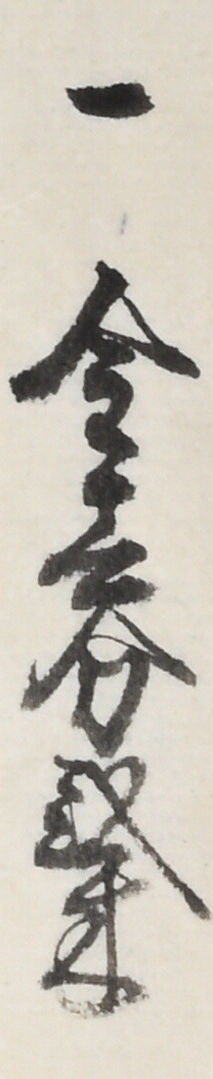一金壱分弐朱市蔵
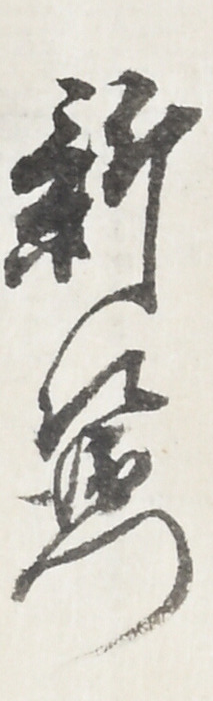新左衛門

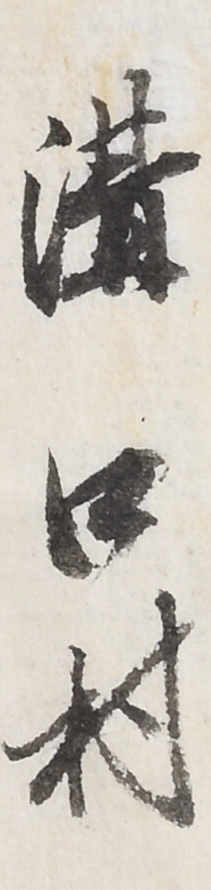溝口村
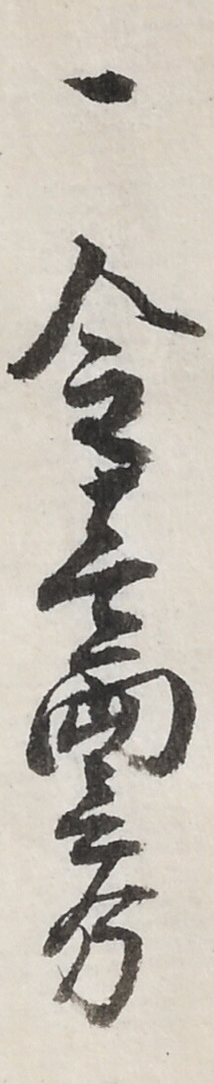一金壱両善八
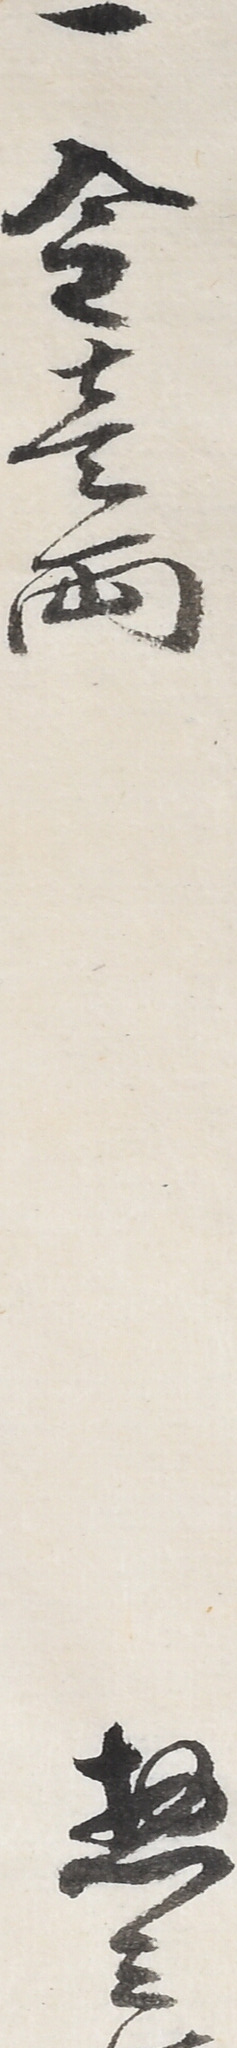一金壱両惣兵衛
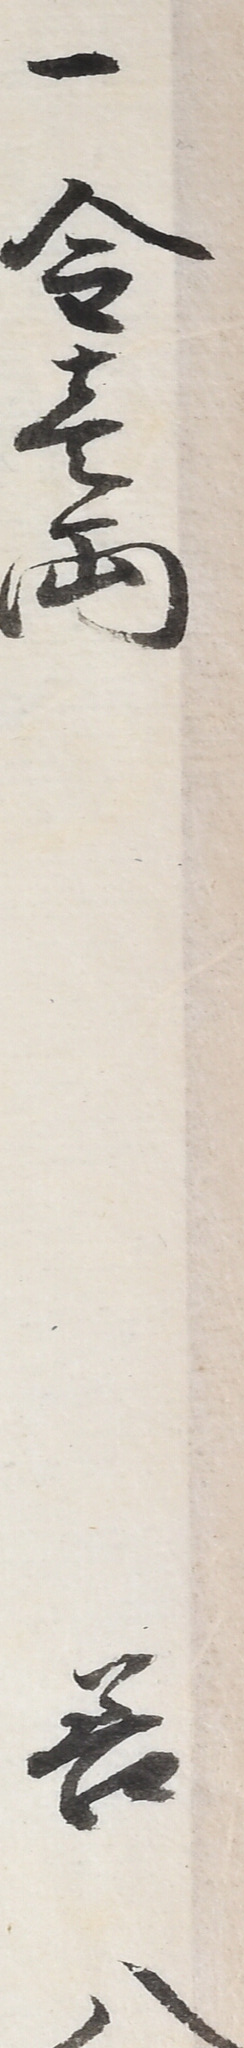一金壱両善八
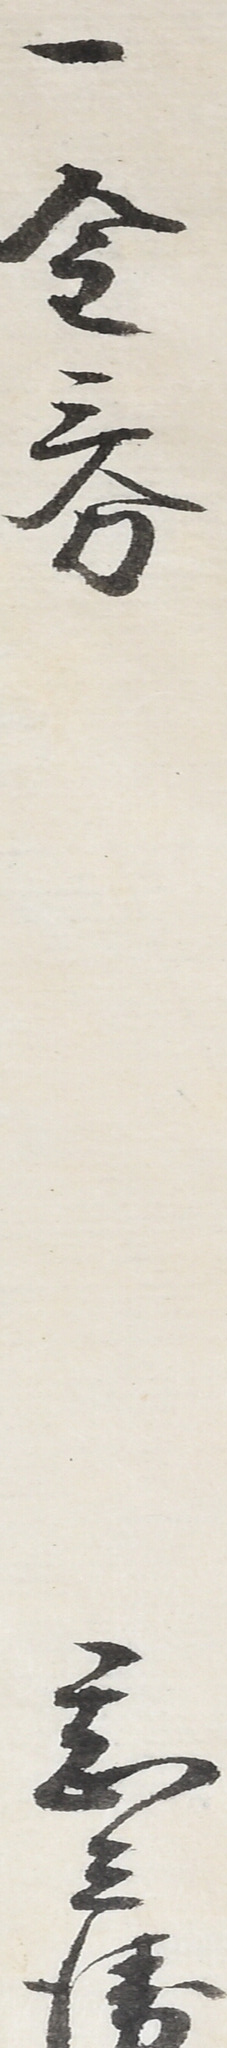一金三分甚兵衛
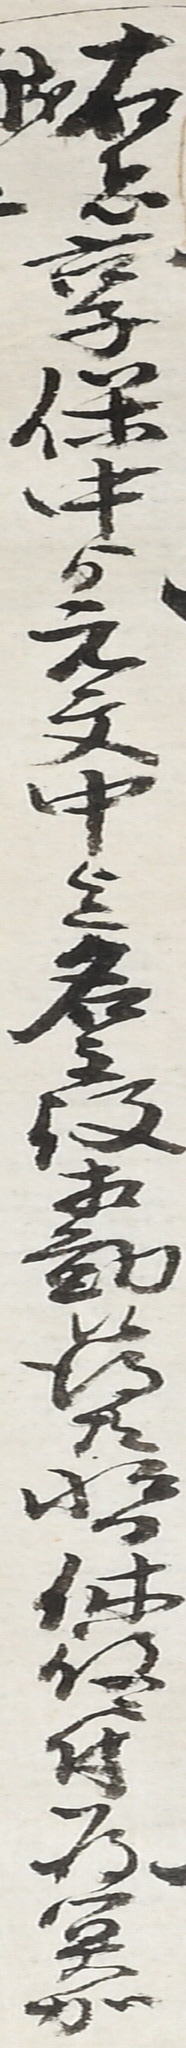右は享保中ゟ元文中迄名主役相勤候得共暫休役ニ付為冥加献上
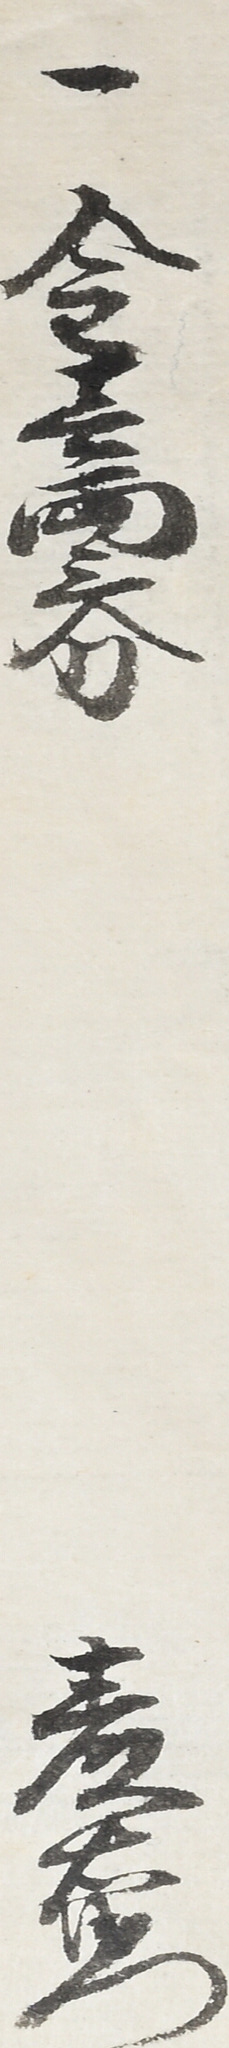一金壱両三分彦右衛門
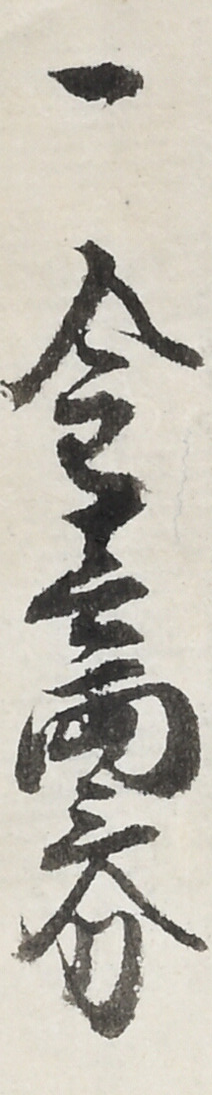一金壱両善八
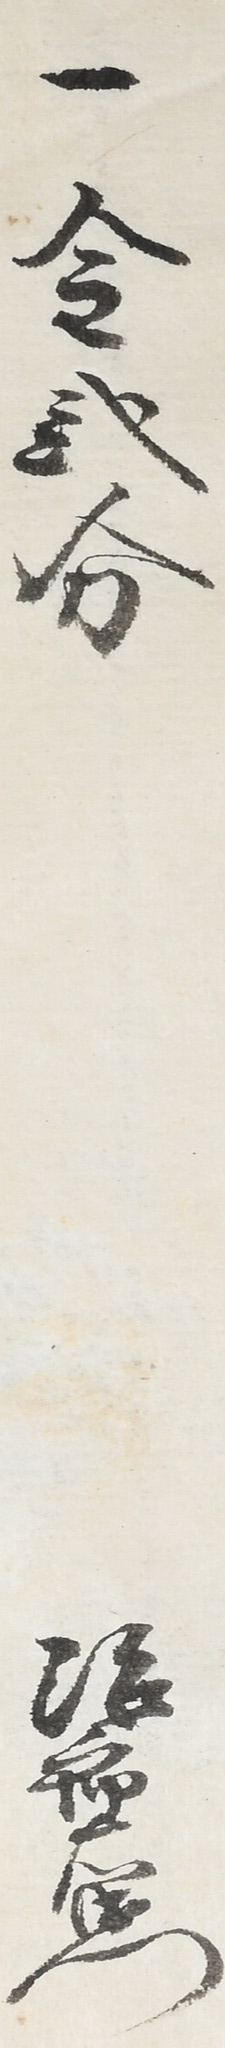一金弐分治郎右衛門

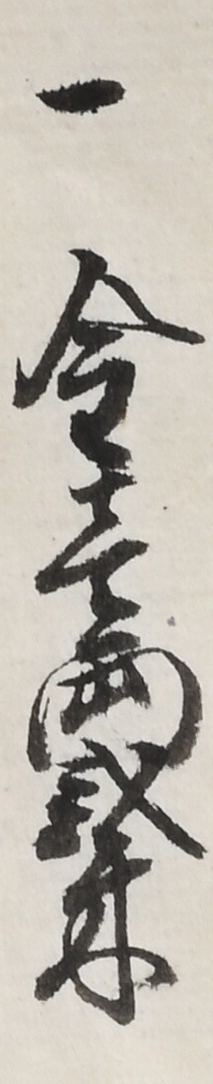一金壱両善七
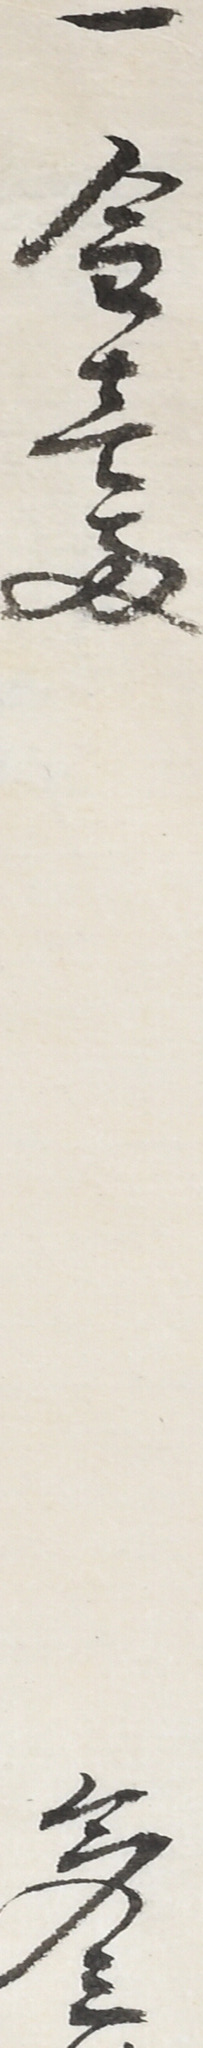一金壱両多兵衛
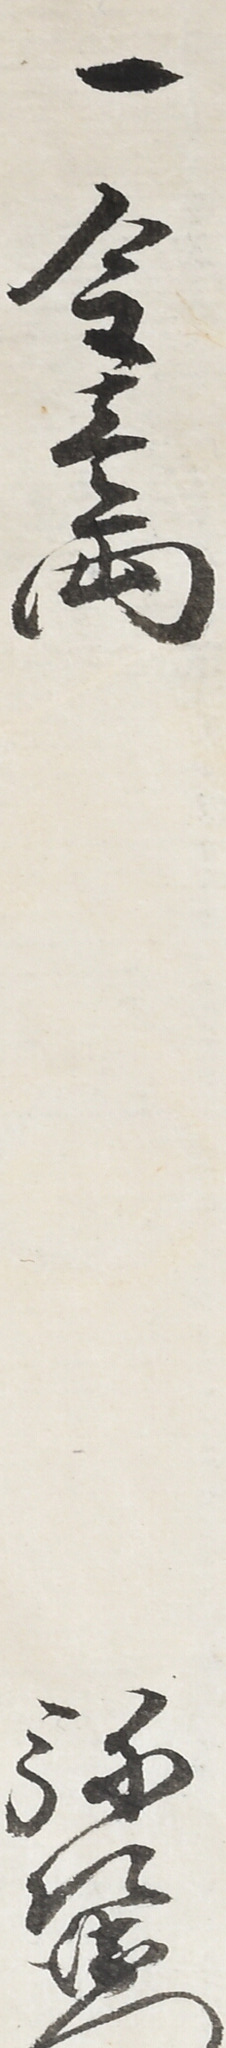一金壱両弥左衛門
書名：御拝地百五拾年御祝儀献上御目録名前
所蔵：伊那市立高遠町図書館・合同会社AMANE
